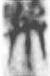與
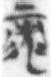彔（綠）
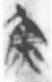魚
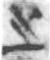之
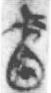○（箙）
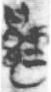○（貍）
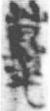○（貘）
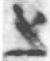之
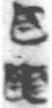聶（攝）
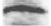一
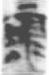彔（綠）
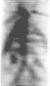魚
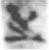之
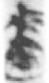○（箙）
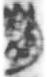○（絶）
